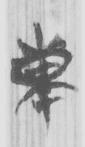東
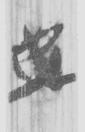𡚦=
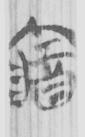𫳼=
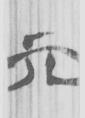亓
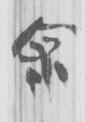罙
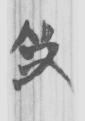及
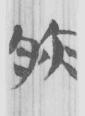{肉亦}=
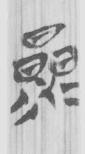{晶㐱}=
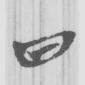日
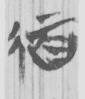{彳百}=
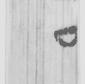四
